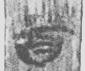百
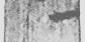一
